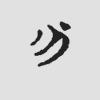分
